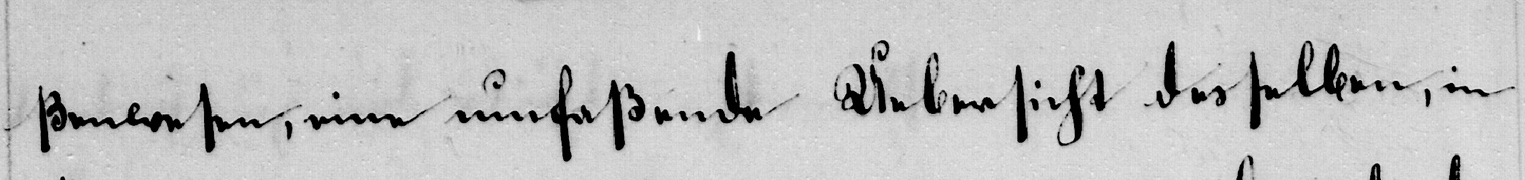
ßenwesen, eine umfaßende Uebersicht desselben, in
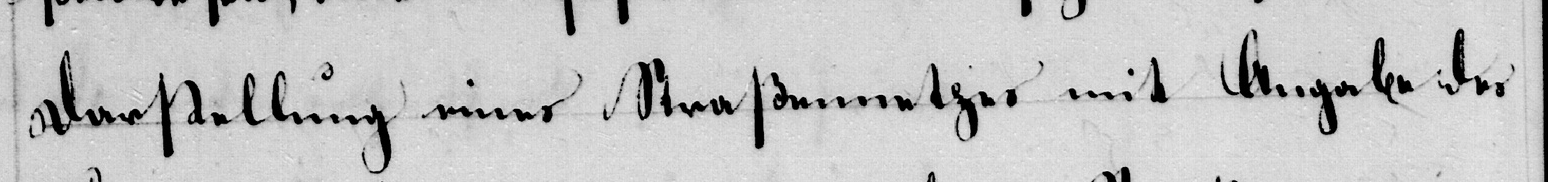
Darstellung eines Straßennetzes mit Angabe des
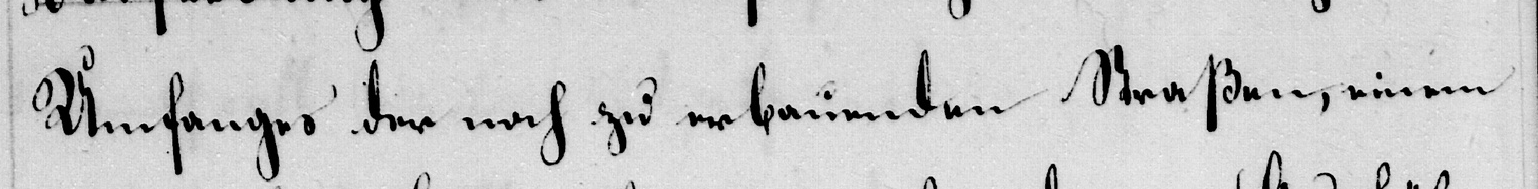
Umfangs der noch zu erbauenden Straßen, einem
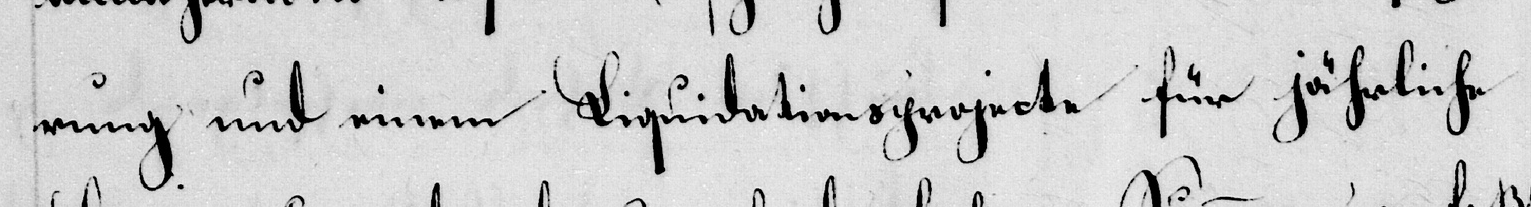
rung und einem Liquidationsprojecte für jährliche
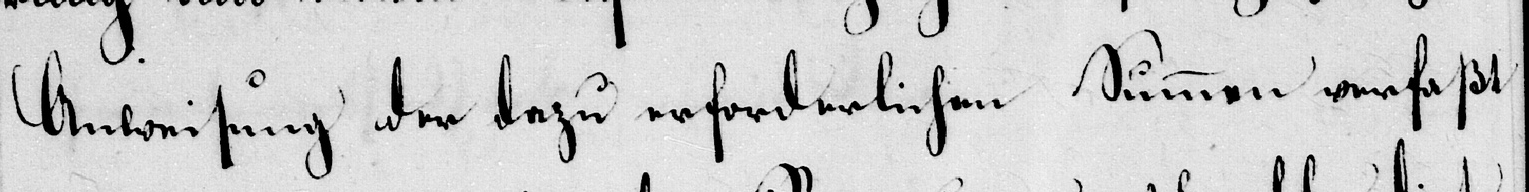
Anweisung der dazu erforderlichen Summen verfaßt
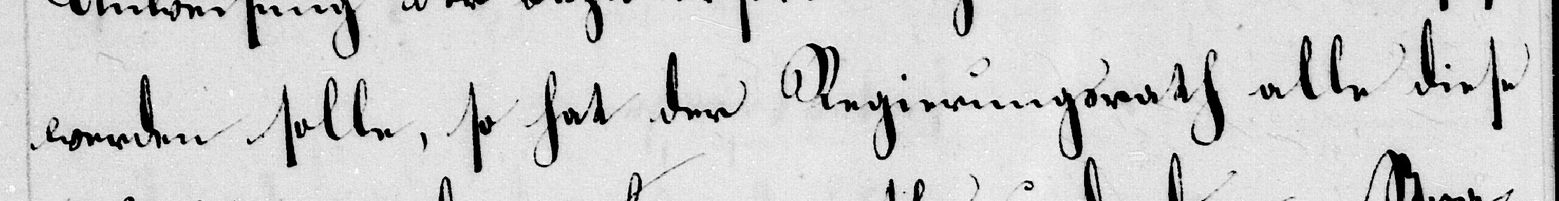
werden solle, so hat der Regierungsrath alle diese
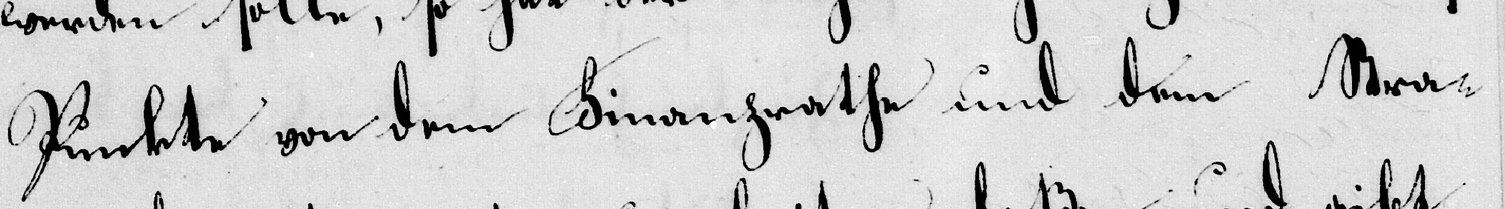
Punkte von dem Finanzrathe und dem Stra¬
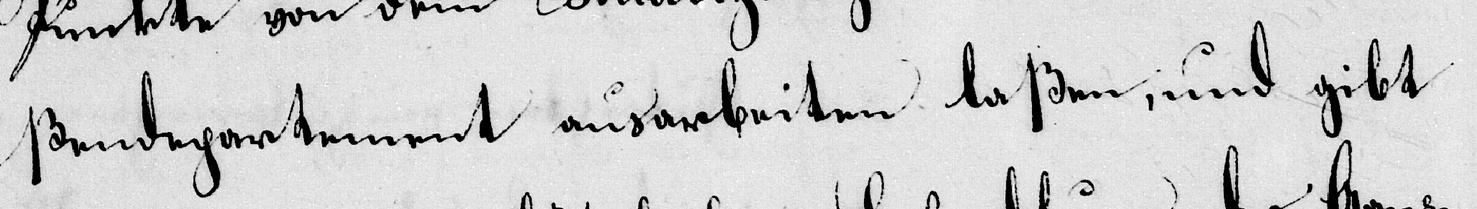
ßendepartement ausarbeiten laßen, und gibt
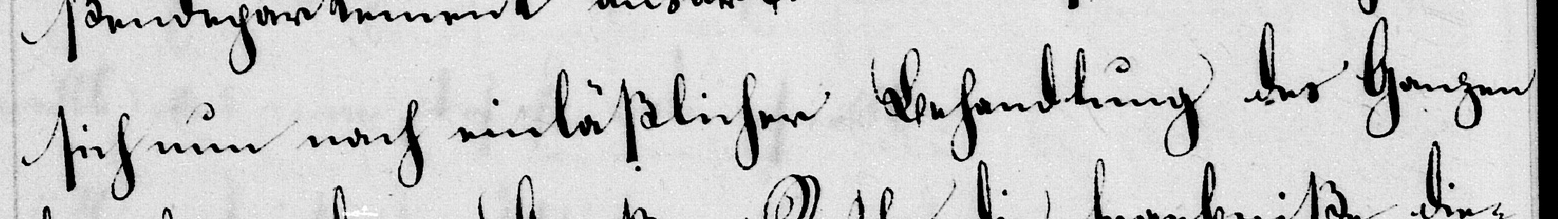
sich nun nach einläßlicher Behandlung des Ganzen
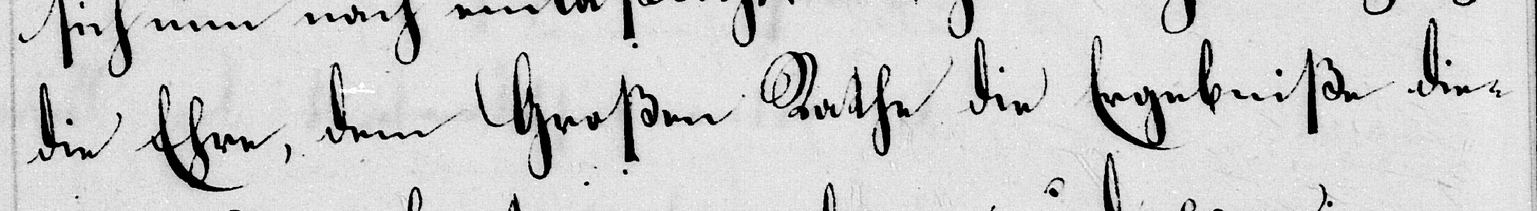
die Ehre, dem Großen Rathe die Ergebniße die¬
